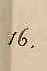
16.
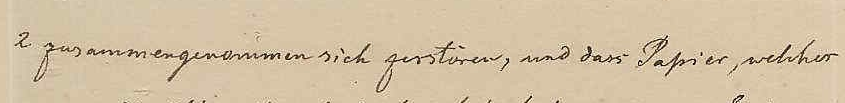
2 zusammengenommen sich zerstören, und dass Papier, welches
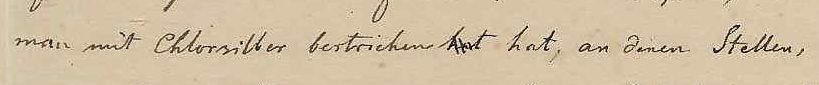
man mit Chlorsilber bestrichen hat hat, an denen Stellen,
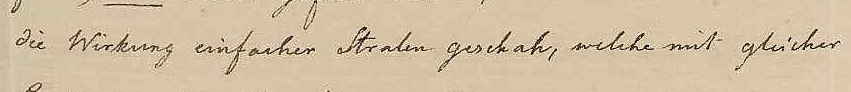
die Wirkung einfacher Stralen geschah, welche mit gleicher
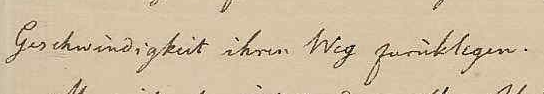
Geschwindigkeit ihren Weg zurüklegen.
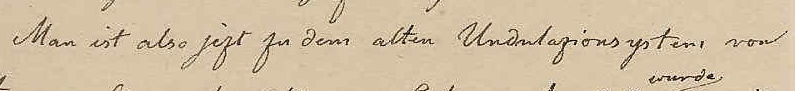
Man ist also jezt zu dem alten Undulazionsystem, von
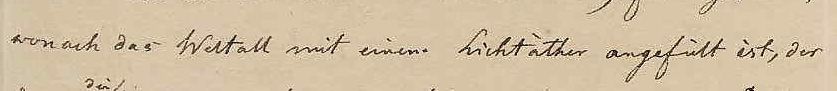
wonach das Weltall mit einem Lichtäther angefült ist, der
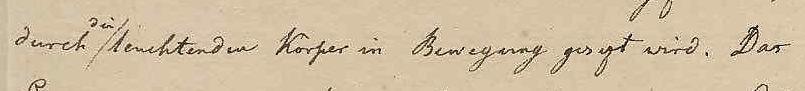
durch die leuchtenden Körper in Bewegung gesezt wird. Das
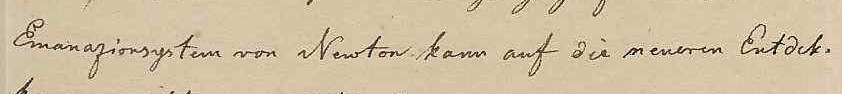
Emanazionsystem von Newton kann auf die neueren Entdek-
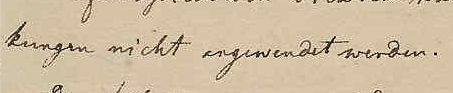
kungen nicht angewendet werden.
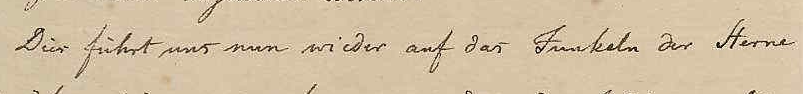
Dies führt uns nun wieder auf das Funkeln der Sterne
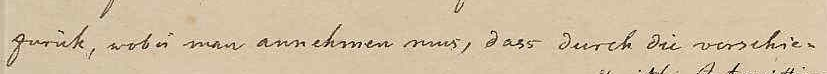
zurük, wobei man annehmen mus, dass durch die verschie-
